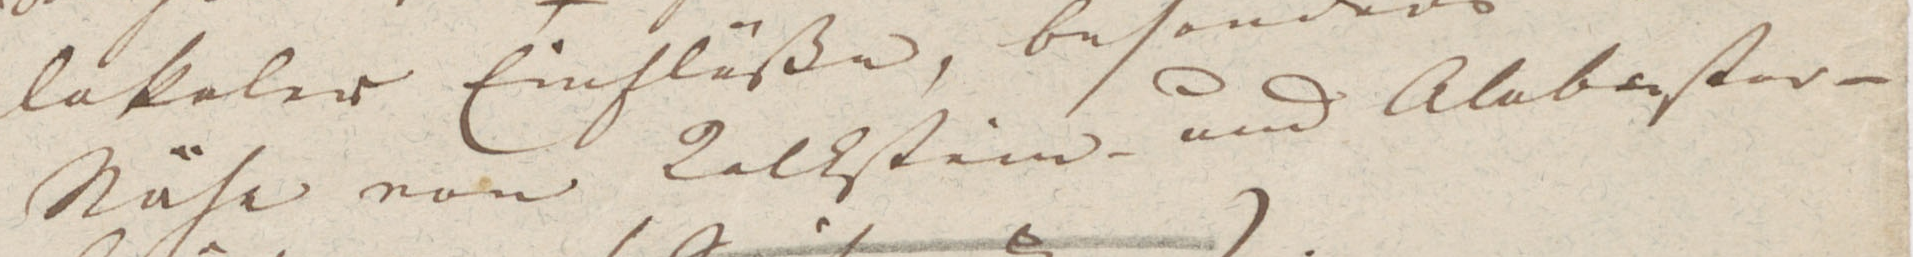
Nähe von Kalkstein- und Alabaster-
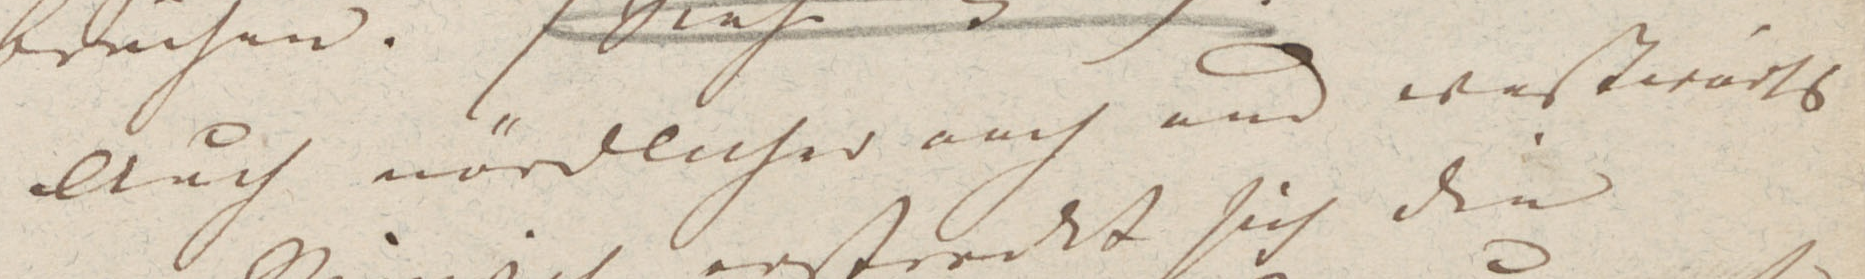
Auch nördlicher noch und westwärts
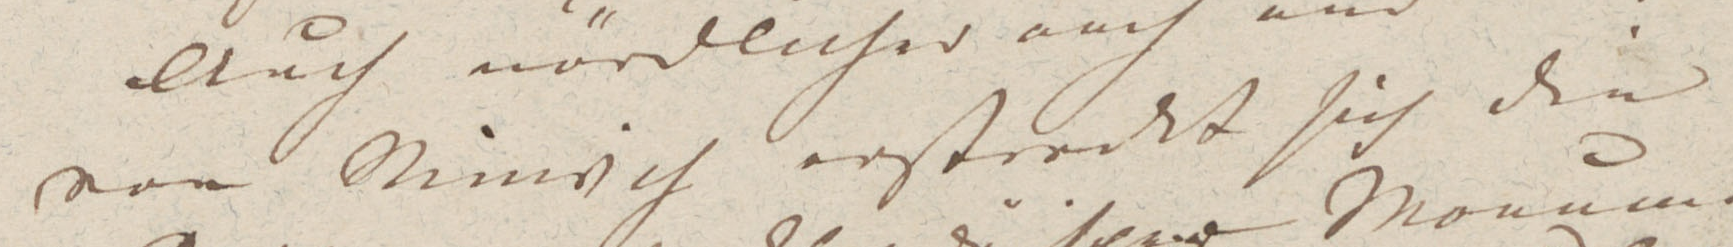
von Niniveh erstreckt sich die
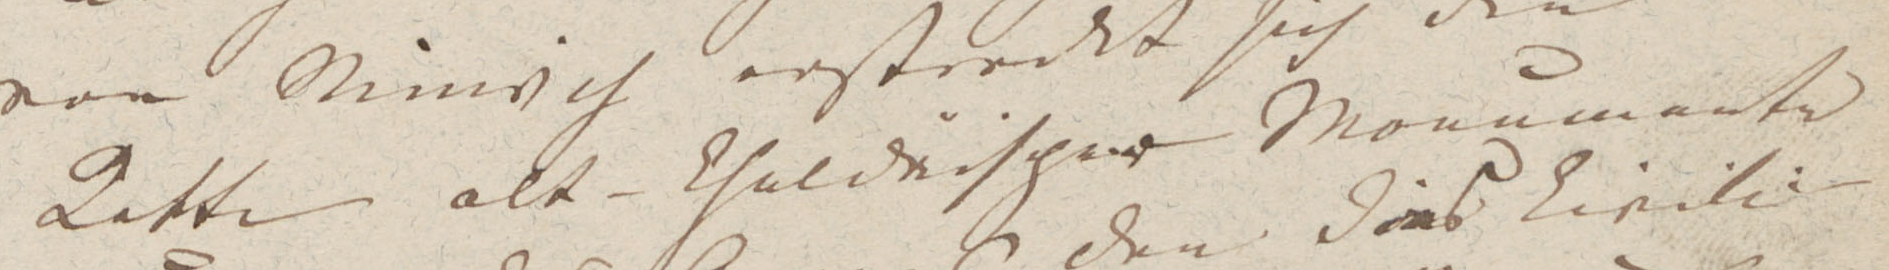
Kette alt-Chaldäischer Monumente
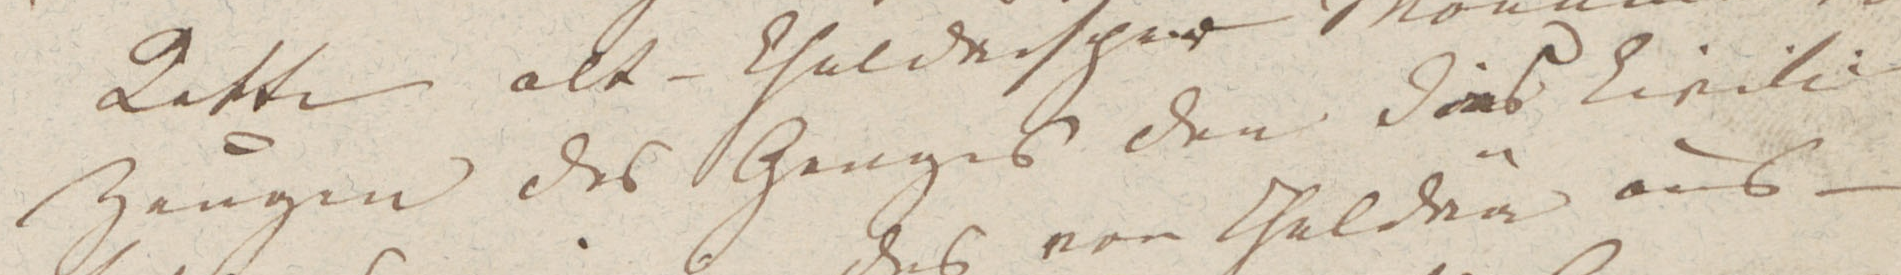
Zeugen des Ganges den dieas Civili-
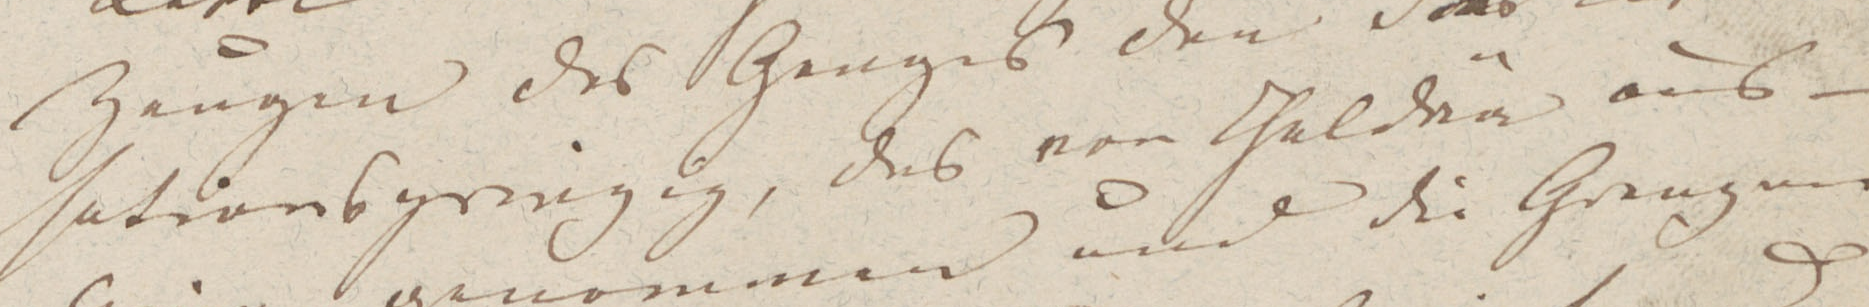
sationsprinzip, das von Chaldäa aus-
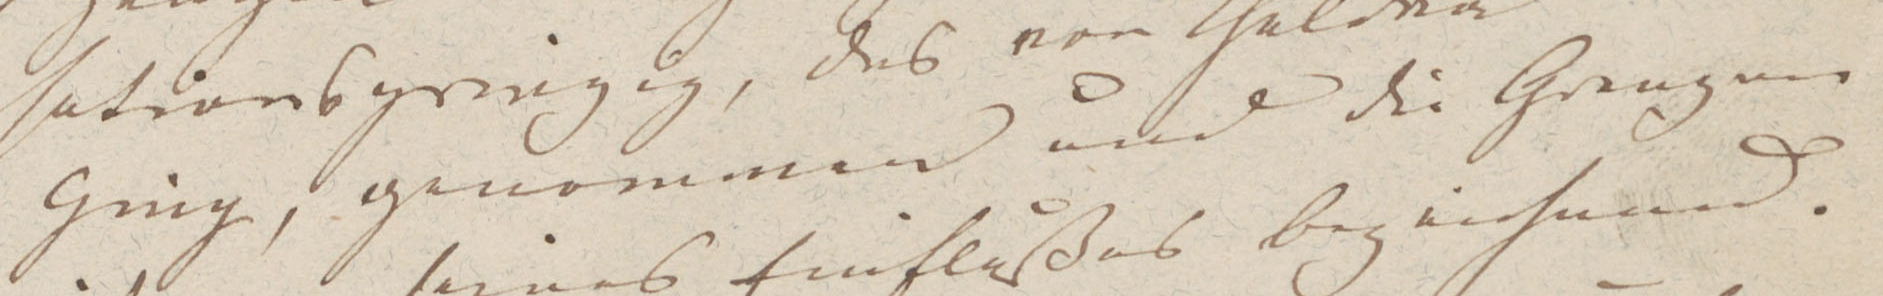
ging, genommen und die Grenzen
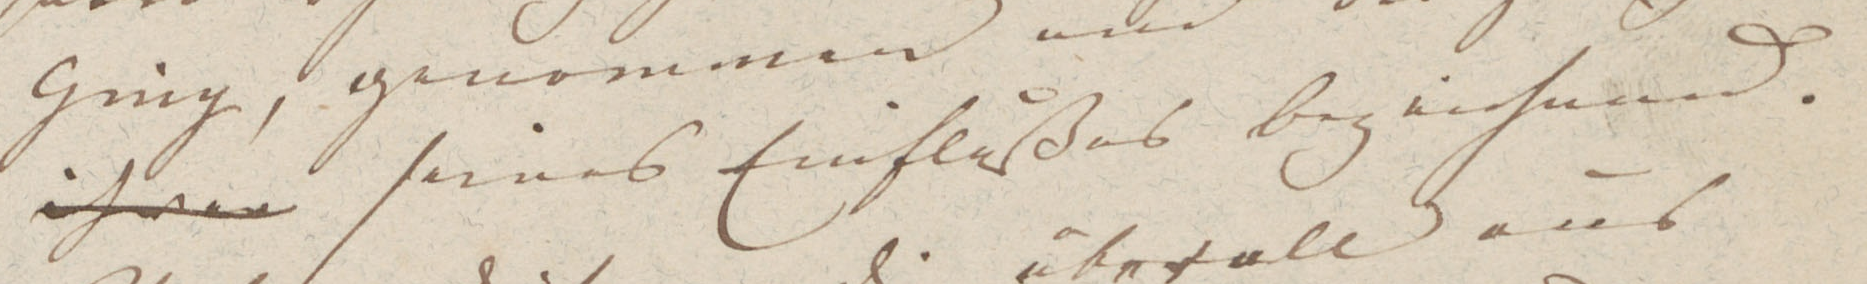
ihren seines Einflusses bezeichnend.
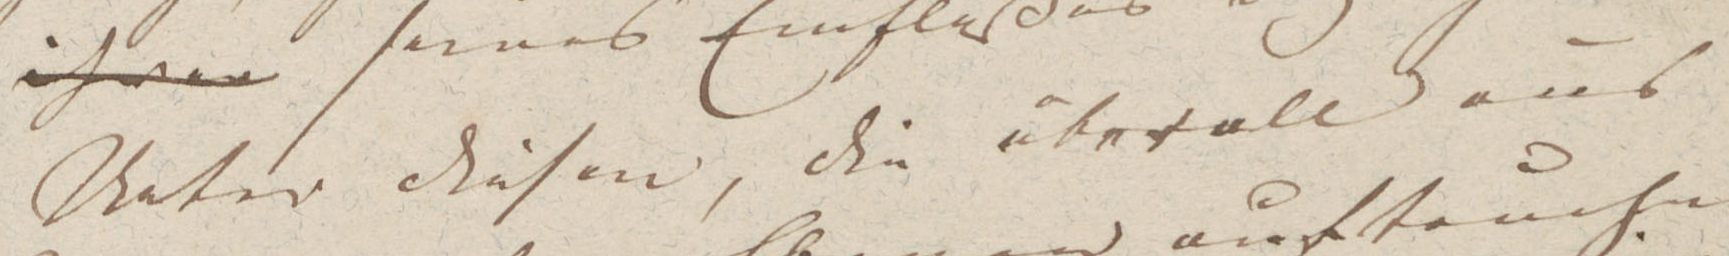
Unter diesen, die überall aus
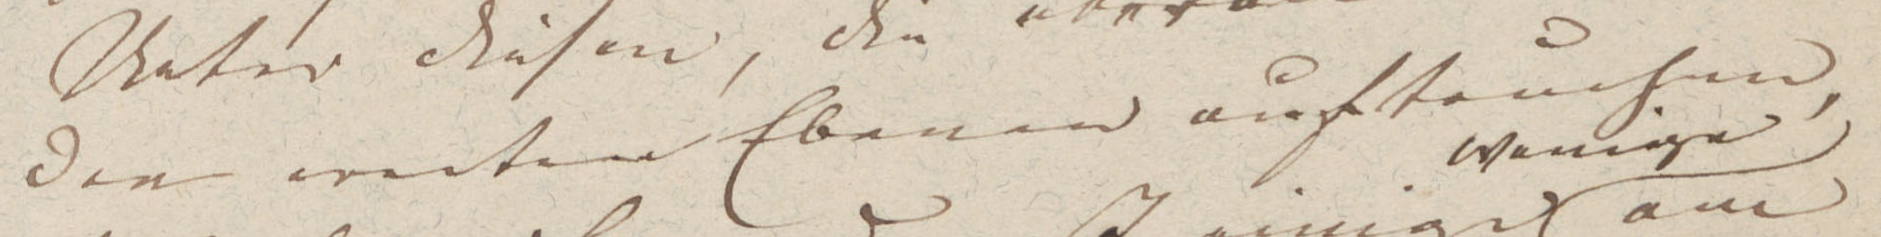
den weiten Ebenen auftauchen,
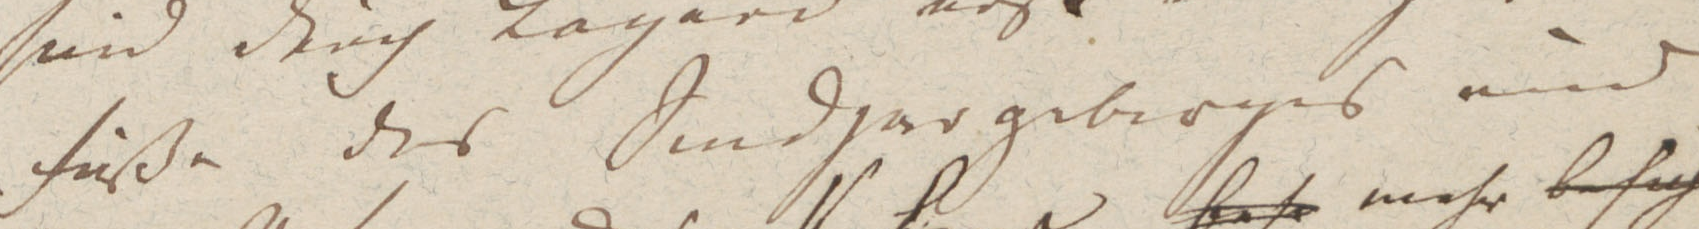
Fusse des Sindjargebirges und
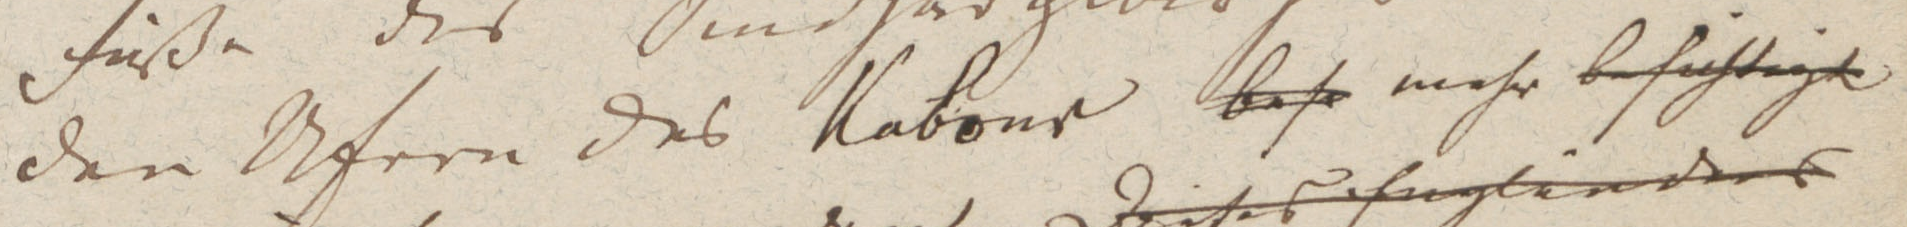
den Ufern des Kabour besi mehr besichtigt
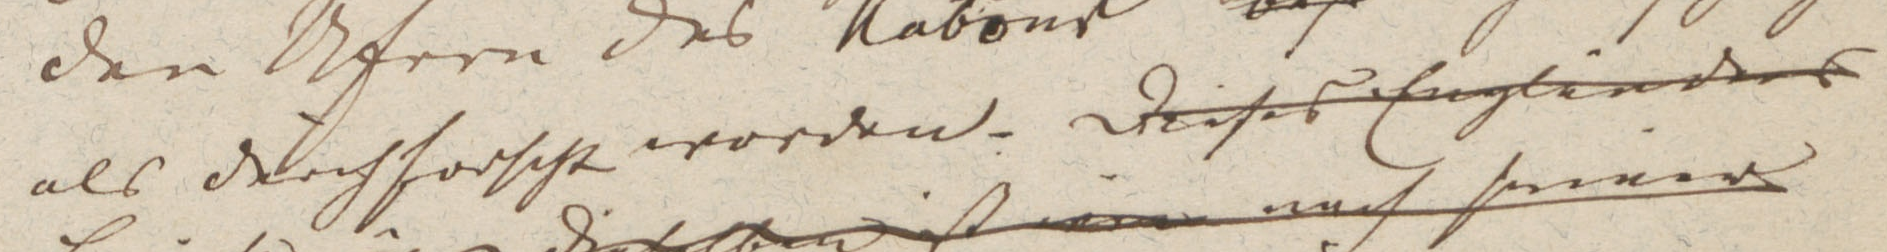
als durchforscht worden. Dieses Engländers
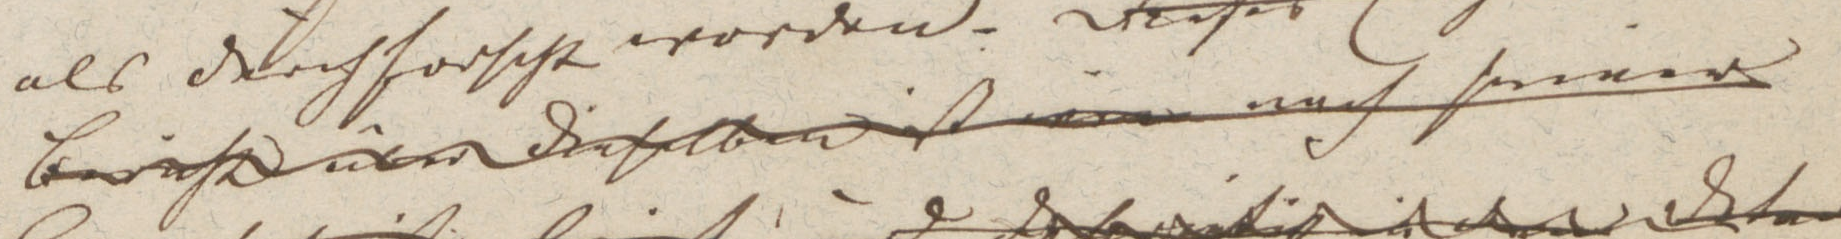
Bericht über dieselben ist wie nach seiner
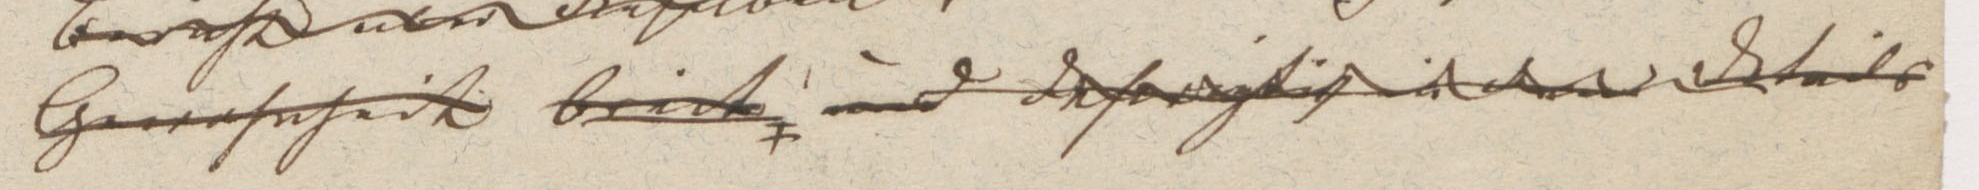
Gewohnheit breit, und in den Details
